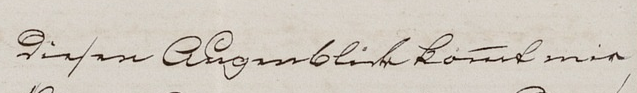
Diesen Augenblick kommt mir
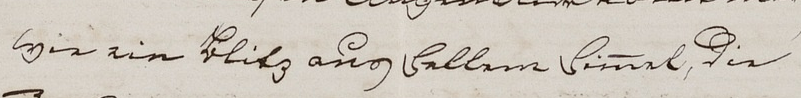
wie ein Blitz aus hellem Himmel die
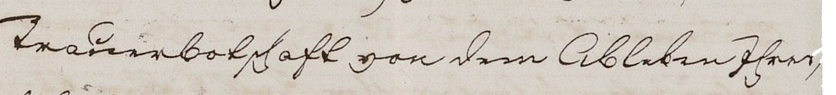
Trauerbotschaft von dem Ableben Ihres
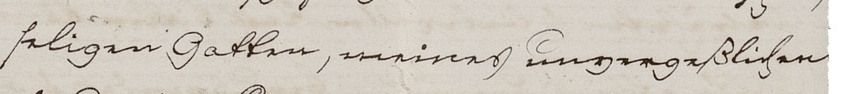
seligen Gatten, meines unvergeßlichen
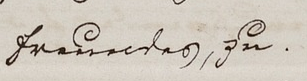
Freundes, zu.
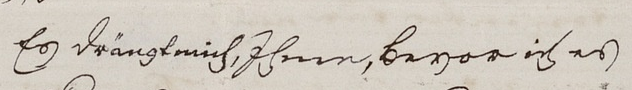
Es drängt mich, Ihnen, bevor ich es
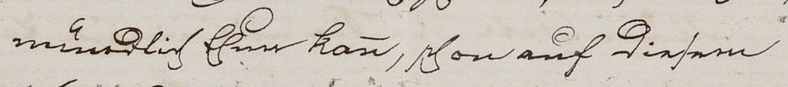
mündlich thun kann, schon auf diesem
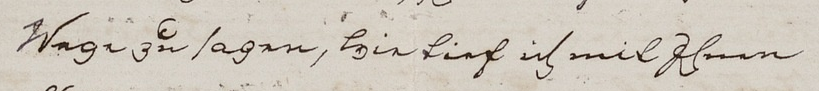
Wege zu sagen, wie tief ich mit Ihnen
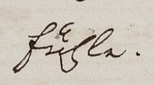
fühle.
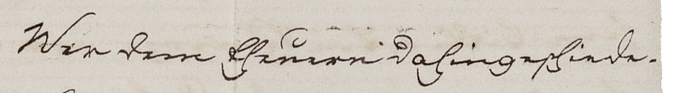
Wer dem theuern Dahingeschiede-
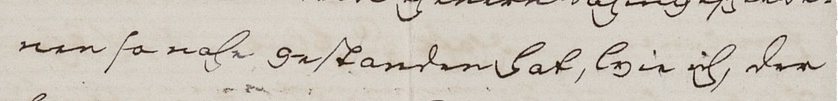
nen so nahe gestanden hat, wie ich, der
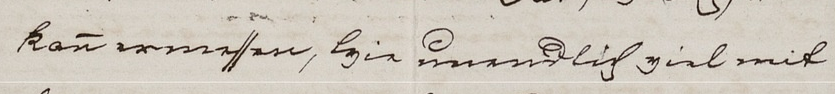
kann ermessen, wie unendlich viel mit
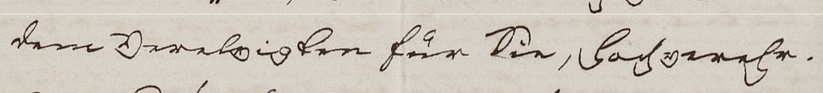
dem Verewigten für Sie, hochverehr-
